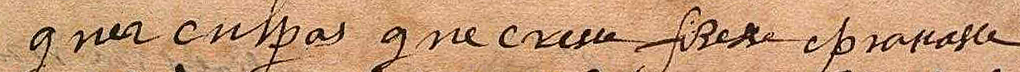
quer culpas que cresse fizesse e prouasse
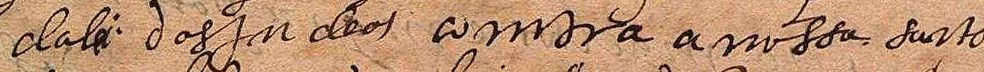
da lei dos Judeos comtra a nossa santa
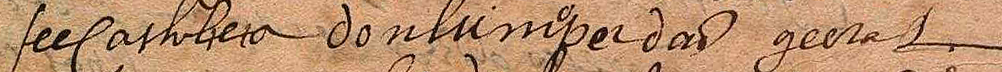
fee Catholica do ultimo perdaõ geeraL
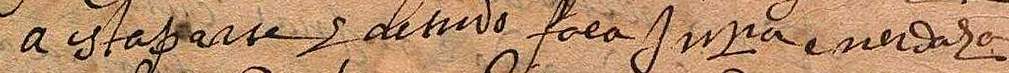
a esta parte E de tudo faca Justia e uerdadra
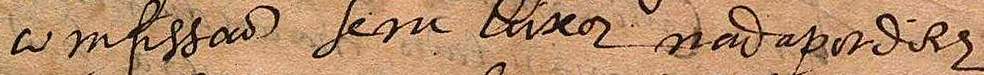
comfissaõ sem leixar nada por diser
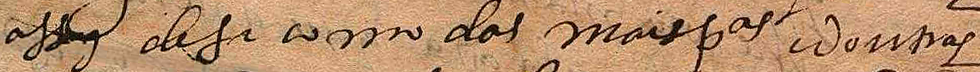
assy de si como das mais pas e doutras
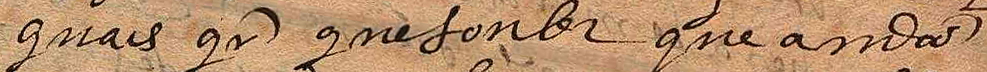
quais qr̅ que souber que andaõ
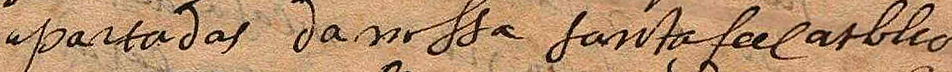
apartadas da nossa santa fee Catholca
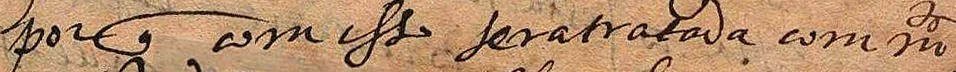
porq̅ com isso sera tratada com mta
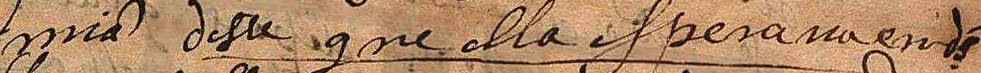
mia̅ disse que ella esperaua em ds̄
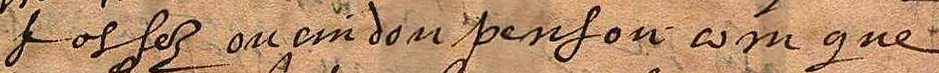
se os fez ou cuidou pensou com que
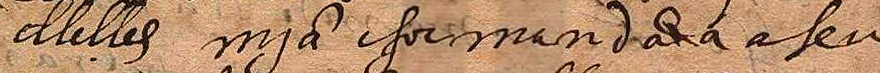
dlelles mja̅ e foi mandada a seu
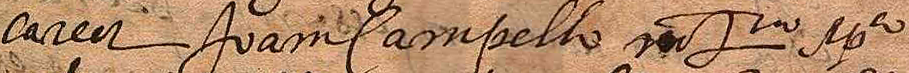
carcer Joam Campello notrio Apco
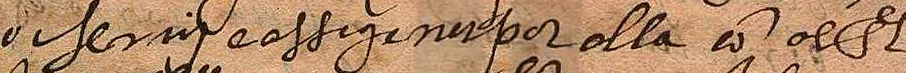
o escruj e assigenei por ella co̅ os ses
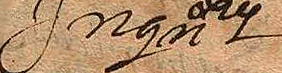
Jnquores
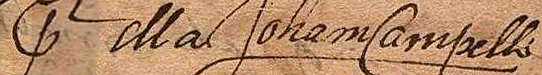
p̄or ella Joam Campello
